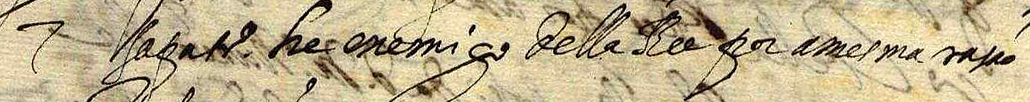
sapatr.o he enemigo della Ree por a mesma rasaõ
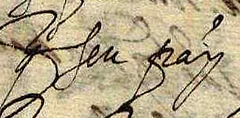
q̄ seu pay
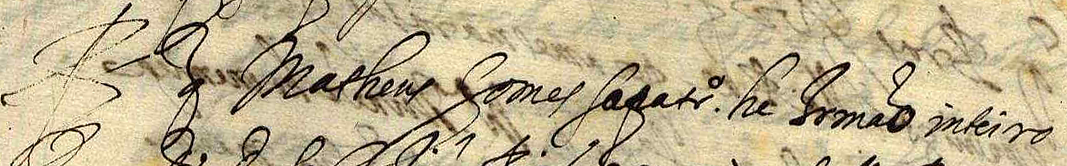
Ꝓ 8 q̄ Matheus Gomes sapatr.o he Irmaõ inteiro
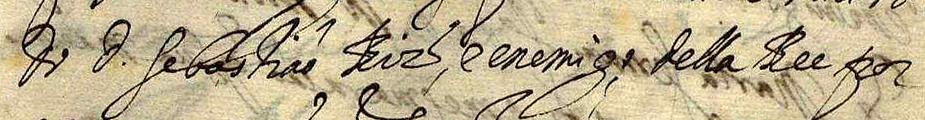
do d. sebastiaõ Riz̄, e enemigo della Ree por
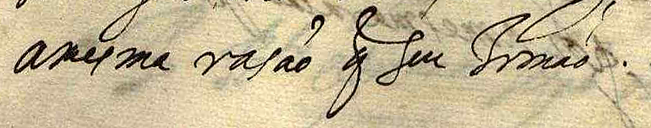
a mesma rasaõ q̄ seu Irmaõ.
